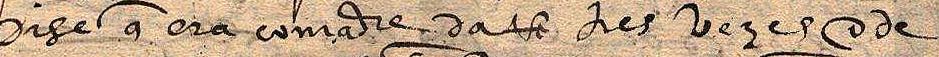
dise q̄ era comadre da Re tres vezes e de
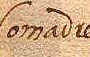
Comadre
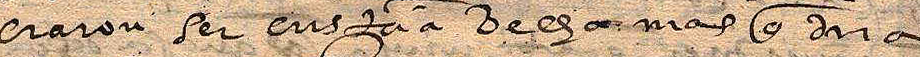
crarou ser cristāa velha mas q̄ dira
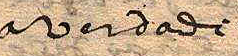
a verdade.
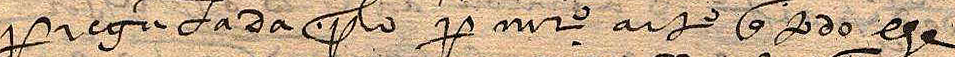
Pregūtada p̄lo p̄mro arto q̄ todo lhe
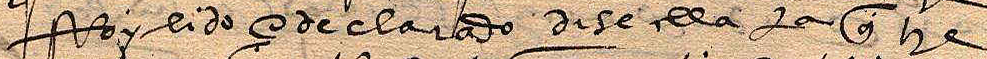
ffoy lido e declarado dise ella ta q̄ he
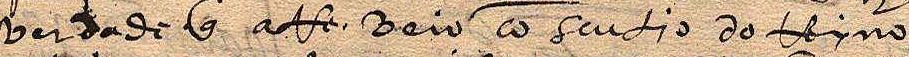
verdade q̄ a Re veio c̄o seu tio do Reyno
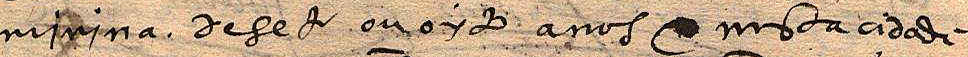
mjnjna . de sete ou oyto anos e nesta çidade
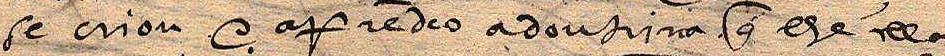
se criou e aprēdeo a doutrjna q̄ lhe ella
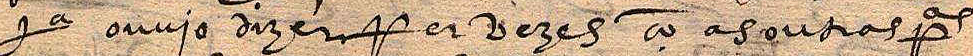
ta ouujo dizer per vezes c̄o as outras pas
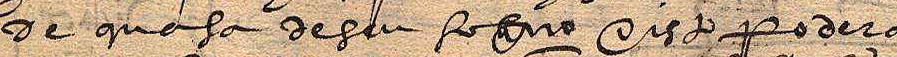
de quasa de seu sogro e isto podera
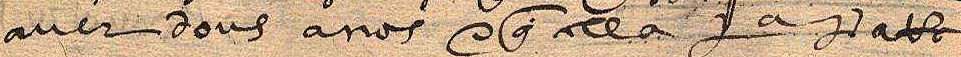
auer dous anos e q̄ ella ta tē a Re
